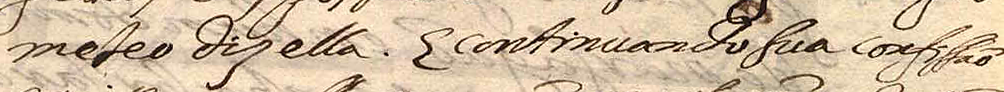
meteo dizella. E continuando sua confissaõ
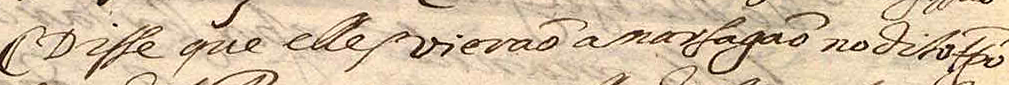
¶ Disse que elles vieraõ a marsagaõ no dito tpō
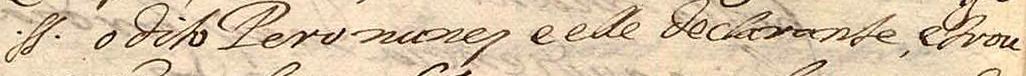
.ss. o dito Pero nunez e elle declarante, e trou
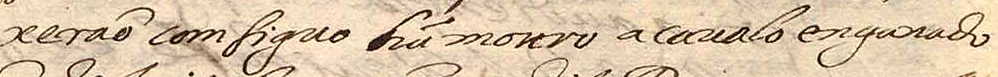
xeraõ comsiguo hū mouro a caualo enganado
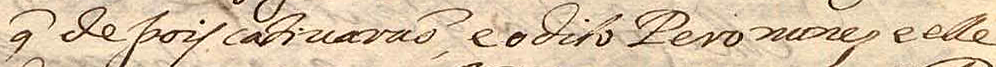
q̄ depois catiuaraõ, e o dito Pero nunez e elle
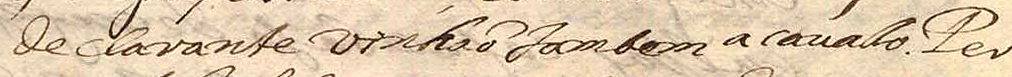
declarante vinhaõ tambem a cauallo. Per
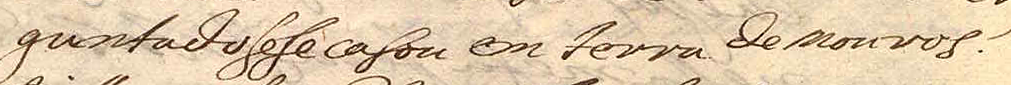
guntado se se casou em terra de mouros?
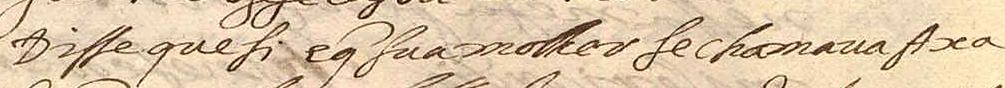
Disse que si e q̄ sua molher se chamaua Axa
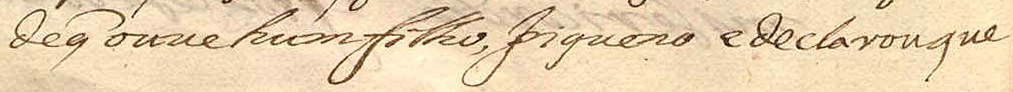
de q̄ ouue hum filho, piqueno e declarou que
